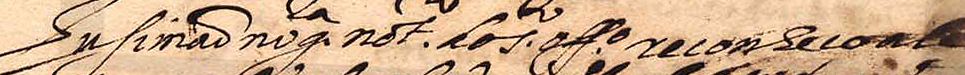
Eu Simão nog.ra not.ro do s.to off.o reconheço a le
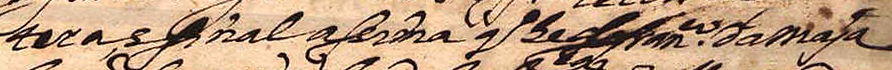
tera, E sinal assima q̄ he de fran.co da maja
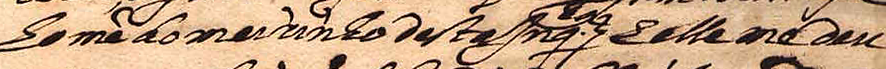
homē do meirinho desta Jnq.aõ E elle me deu
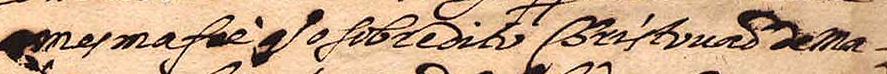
_ mesma fee q̄ o sobredito Christouaõ de ma
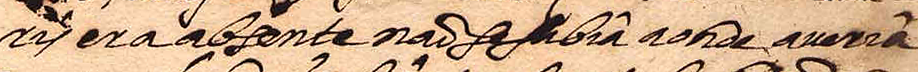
ris era absente naõ se sabia aonde aueriā
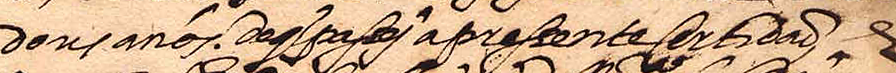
dous anōs. de q̄ passej a pressente Certidaõ, E
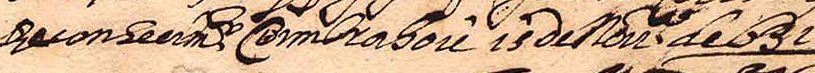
Reconhecim.to Coimbra hoie 15 de Nou.ro de 631
